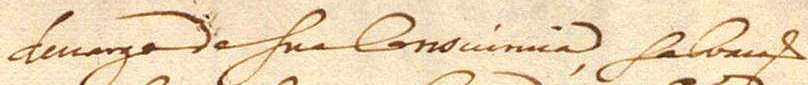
descargo de sua Consciencia, saluacaõ
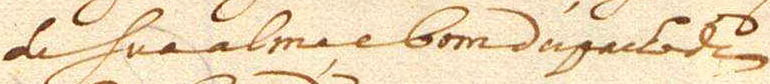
de sua alma, e bom despacho de
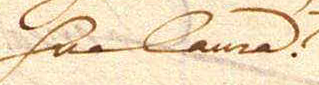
sua Cauza?
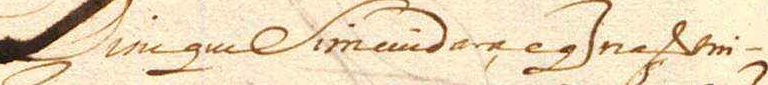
Disse que Sim cuidara, e q̄ naõ tin
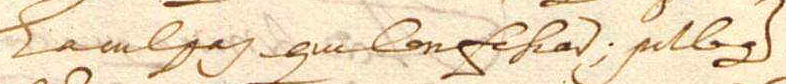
ha culpas que Confessar; pello q̄
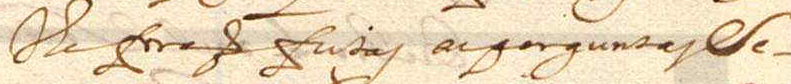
lhe foraõ feitas as perguntas Se
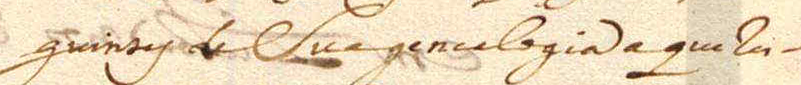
guintes de Sua genealogia a que Res
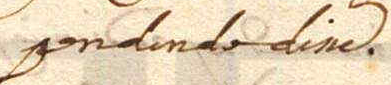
pondendo disse.
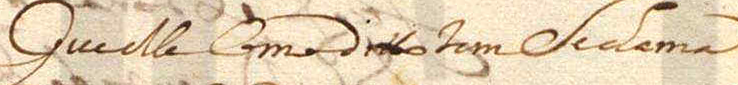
Que elle Como ditto tem Se chama
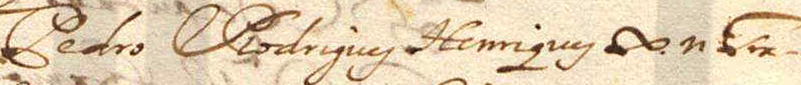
Pedro Rodrigues Henriques x. n. Tra
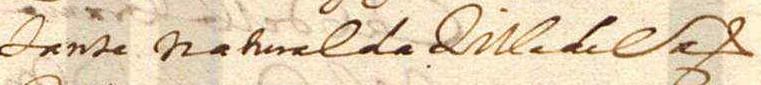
tante natural da Villa de Saõ
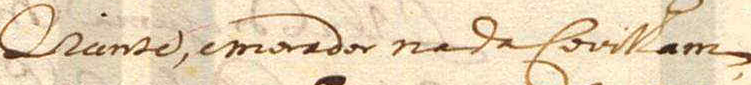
Vicente, e morador na da Covilham,
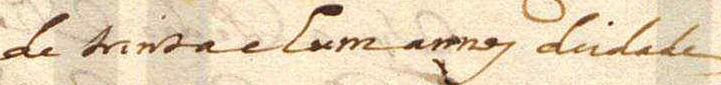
de trinta e hum annos de idade
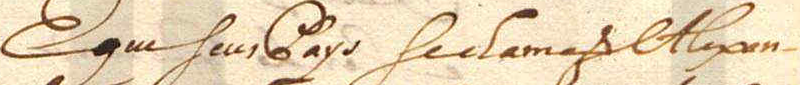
E que seus Pays se chamaõ Alexan
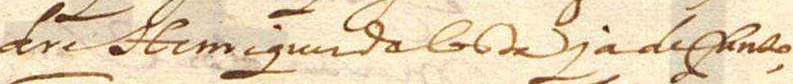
dre Henriques da Costa ja defunto,
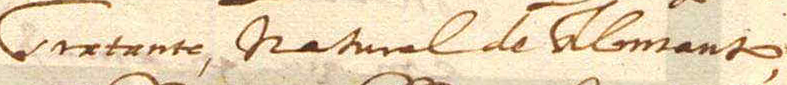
Tratante, natural de Monsanto,
